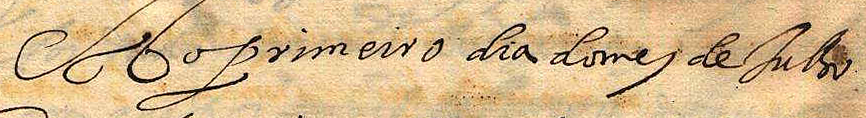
Ao primeiro dia do mes de Julho
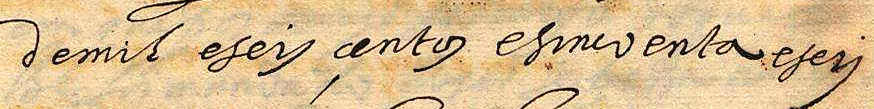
de mil e seiscentos e sincoenta e seis
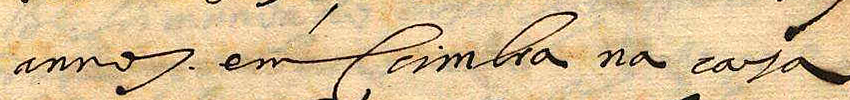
annos em Coimbra na caza
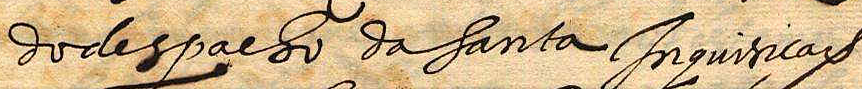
do despacho da santa Jnquisiçaõ
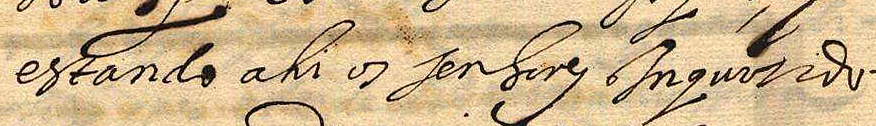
estando ahi os senhores Jnquizido
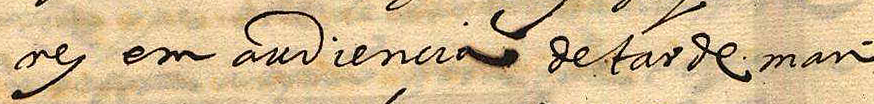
res em audiencia de tarde, man
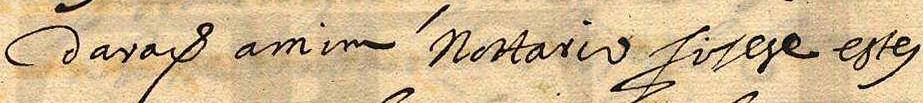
daraõ a mim nottario fizese estes
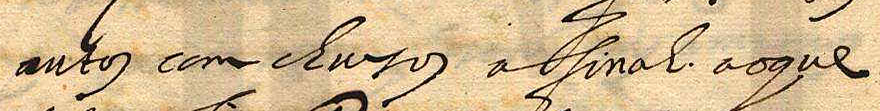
autos comclusos afinal. ao que
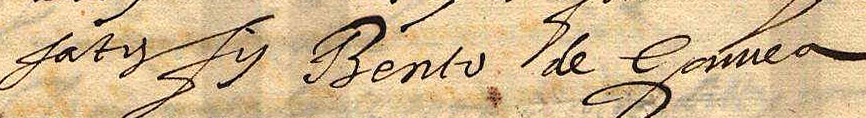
satisfiz Bento de Gouuea
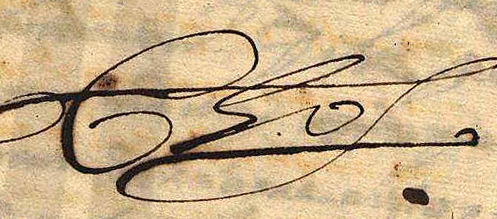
CL.o
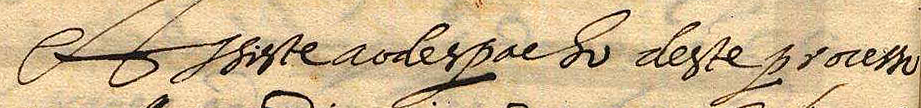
Assiste ao despacho deste processo
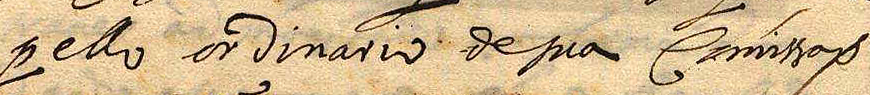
pello ordinario de sua Comissaõ
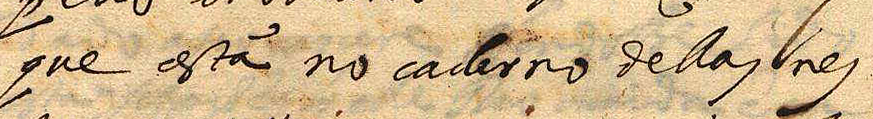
que está no caderno dellas nes
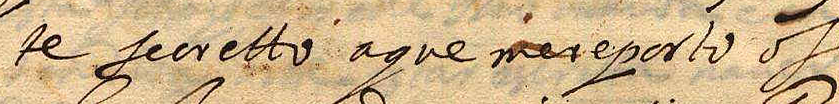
te secretto a que me reporto o Se
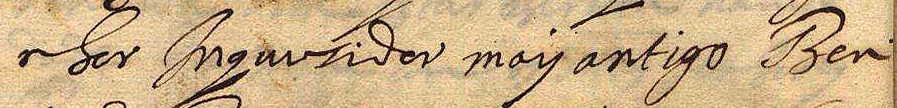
nhor Jnquizidor mais antigo Ben
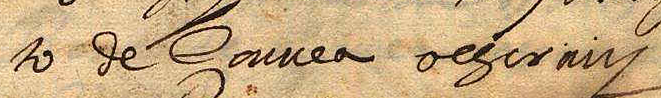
to de Gouuea o escreuy
